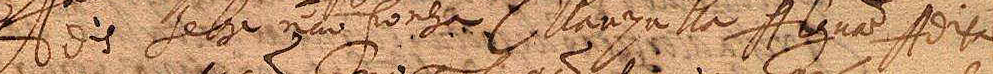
dis se lhe naõ ponha Cllauzulla Alguā A dita
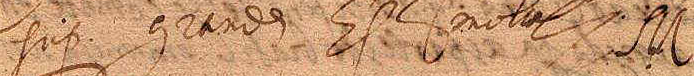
sup. grande Esmola E M
